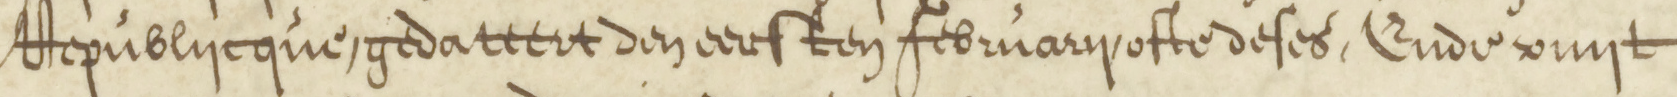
Republycque, gedateert den eersten February, off deses, Ende vuyt
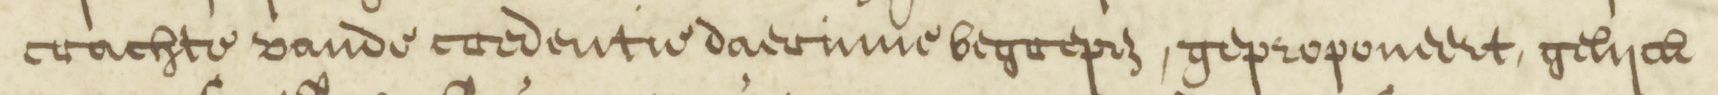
crachte vande credentie daerinne begrepen, geproponeert, gelyck
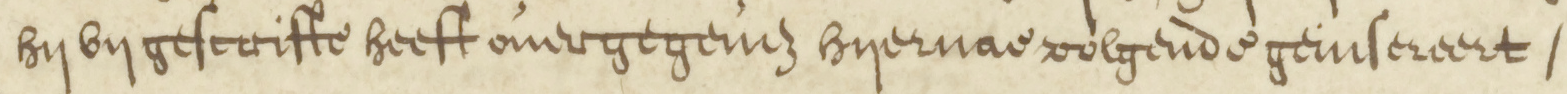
hy by gescrifte heeft ouergegeuen hyernae volgende geinsereert.
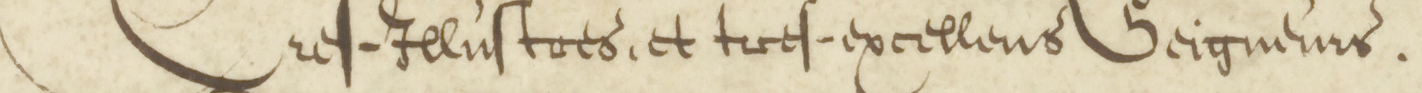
Tres- Illustres, et tres- excellens Seigneurs.
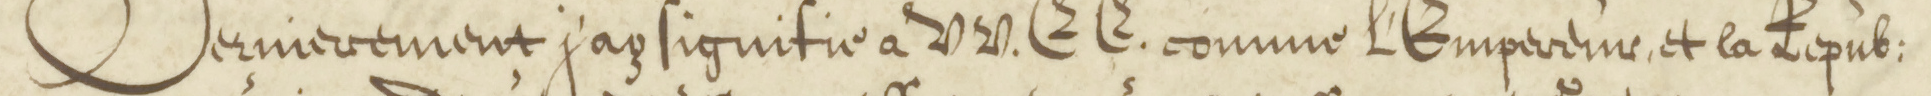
Dernierement j‛ay signifie a V V. E E. comme l‛Empereur, et la Repub:
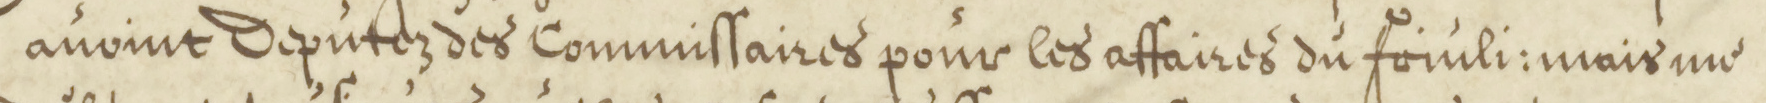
auoint Deputez des Commissaires pour les affaires du fruili: maisme
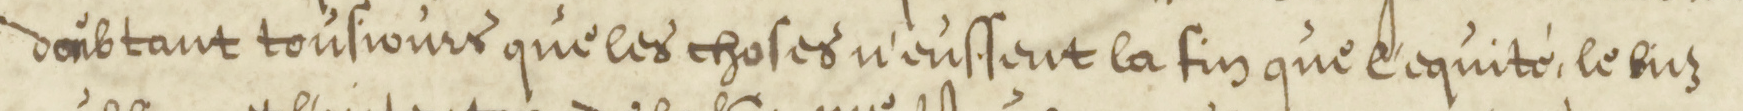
doubtant tousiours que les choses n‛eussent la fin que l‛equité, le vuz
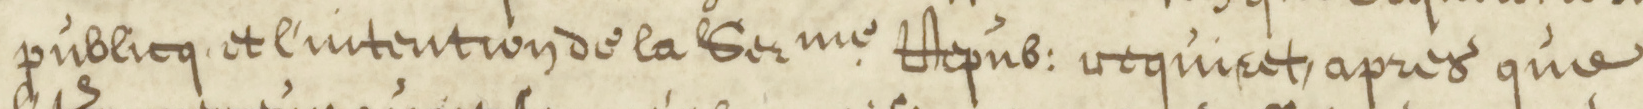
publicq, et l‛intention de la Serme. Repub: requiret, apres que
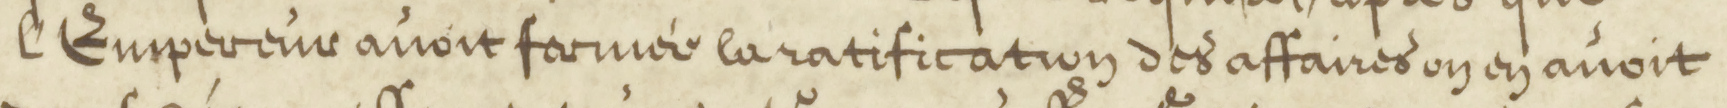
l‛Empereur auoit fermée la ratification des affaires on en auoit
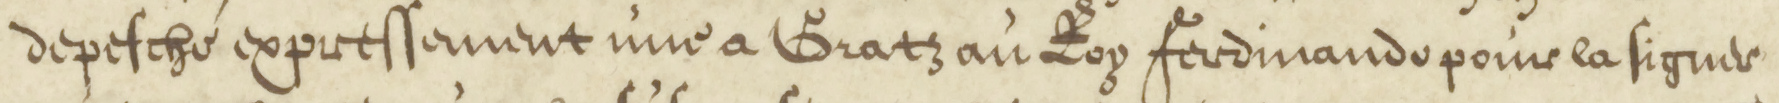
depesché expressement une a Gratz au Roy Ferdinande pour la figuer
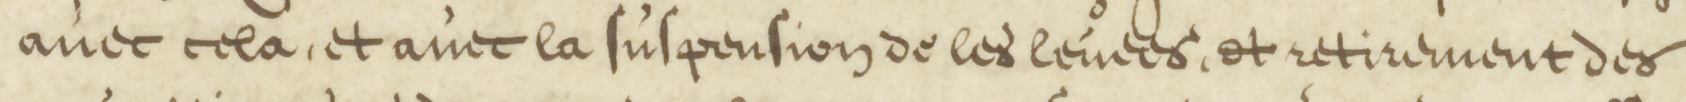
auec cela, et auec la suspension de les léuees, et retirement des
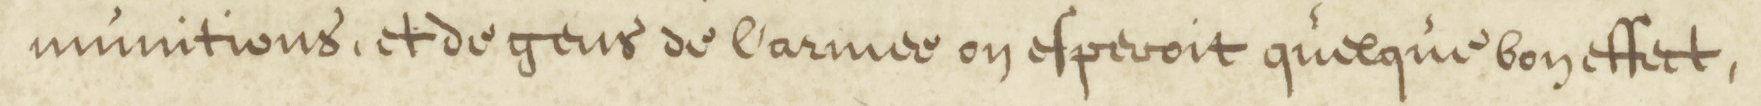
munitions, et de gens de l‛armee ou esperoit quelque bon effect,
